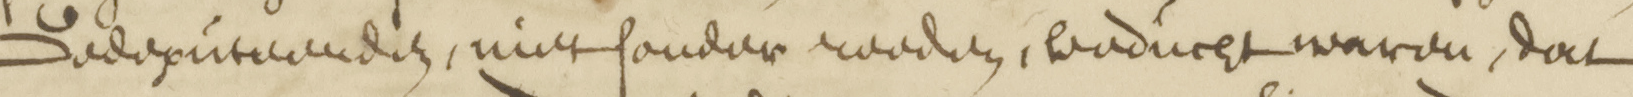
Gedeputeerden, niet sonder reeden, beducht waren, dat
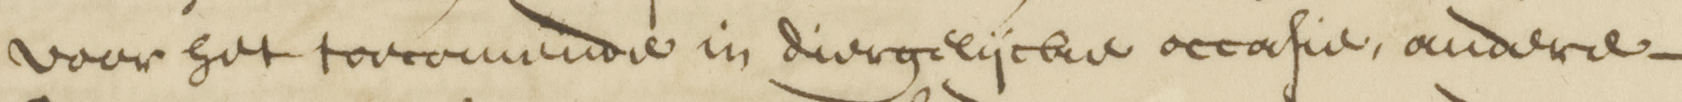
voor het toecomende in diergelijcke occasie, andere —
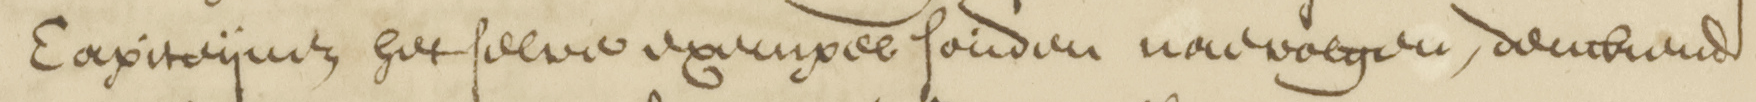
Capiteijnen het selve exempel souden naevolgen, denckende
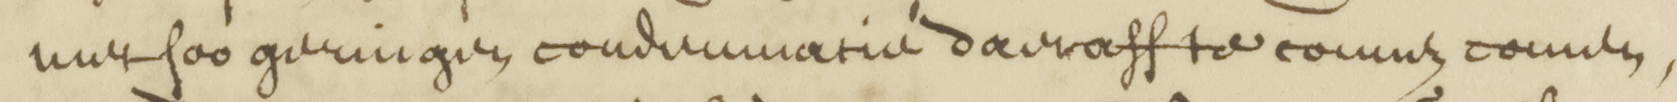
met soo geringen condemnatie daeraff te connen comen,
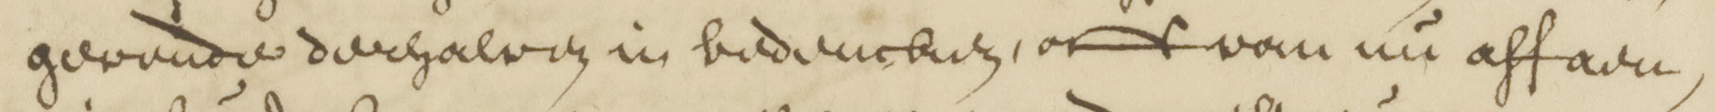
gevende derhalven in bedencken, off van nu aff aen
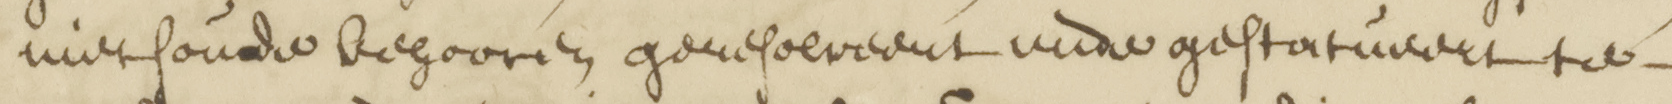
niet soude behooren geresolveert ende gestatueert te
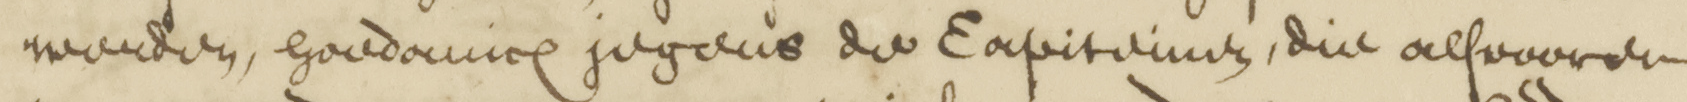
werden, hoedanich jegens de Capiteinen, die alsvooren
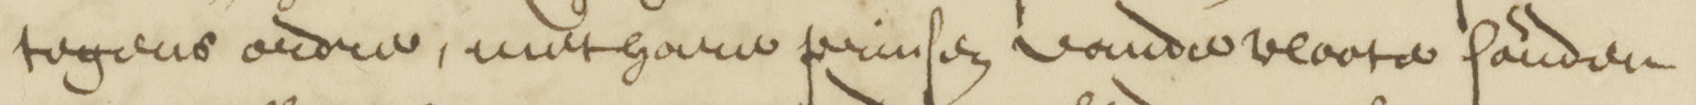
tegens ordre, met hare prinsen vande vloote souden
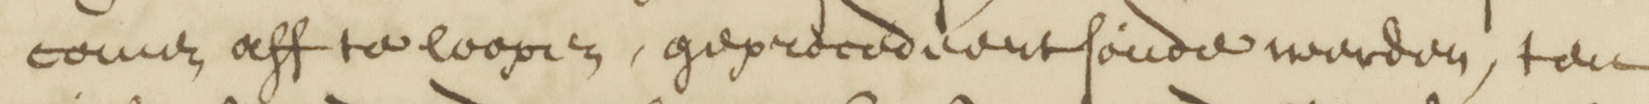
comen aff te loopen, geprocedeert soude werden, ten
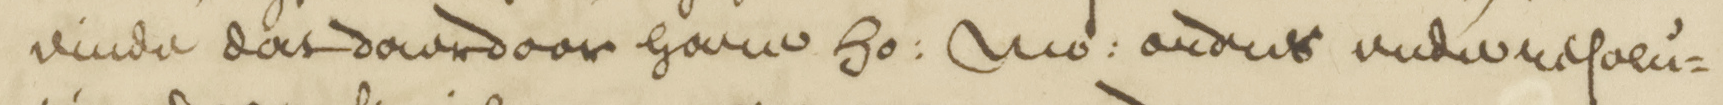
einde dat daerdoor hare Ho:Mo: ordres ende resolu„
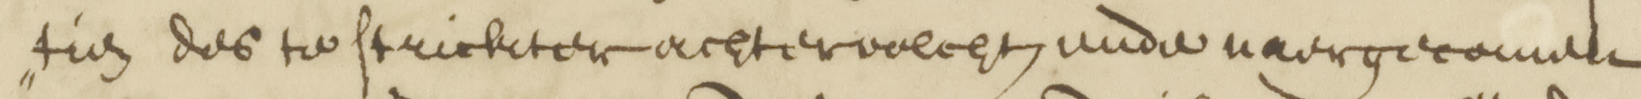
,,tien des te strickter achtervolcht ende naergecomen
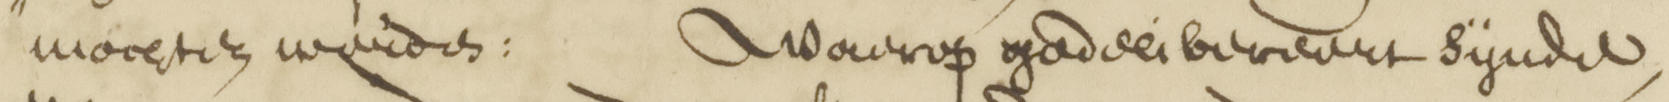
mochten werden: Waerop gedelibereert sijnde,
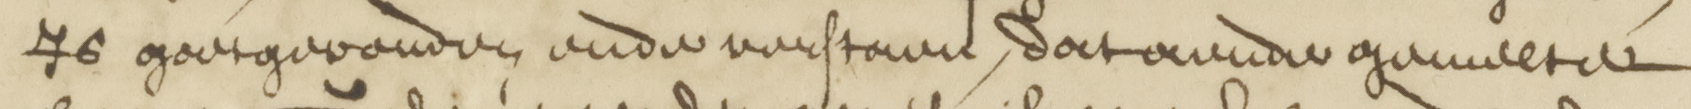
Is goetgevonden ende verstaen, dat aende gemelte
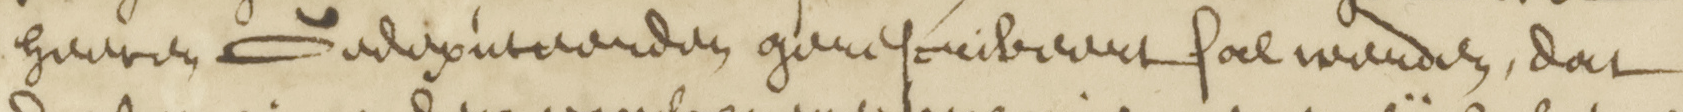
heeren Gedeputeerden gerescribeert sal werden, dat
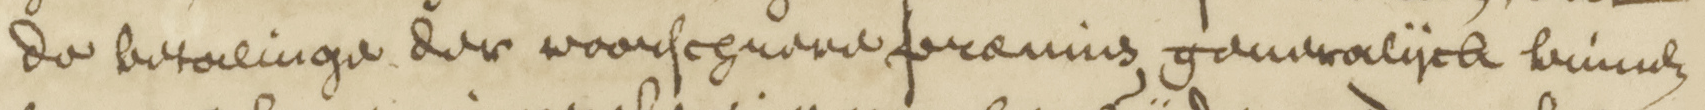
de betalinge der voorschreve premien generalijck binnen
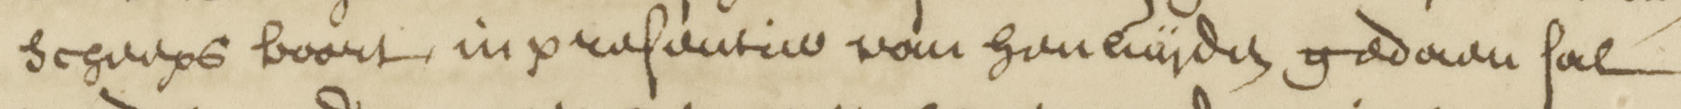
scheeps boort, in presentie van henluijden gedaen sal
